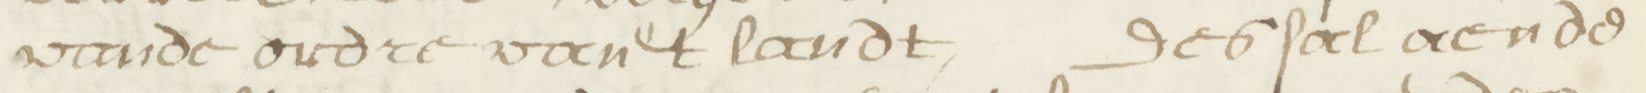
vande ordre van 't landt. Des sal aen de
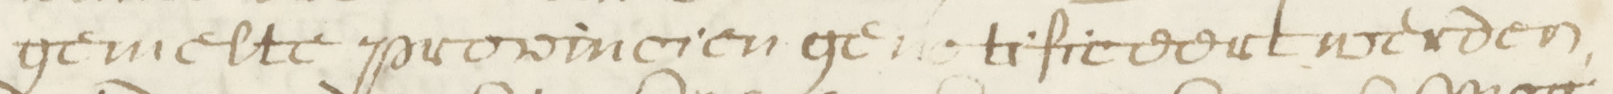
gemelte provincien genotificeert werden,
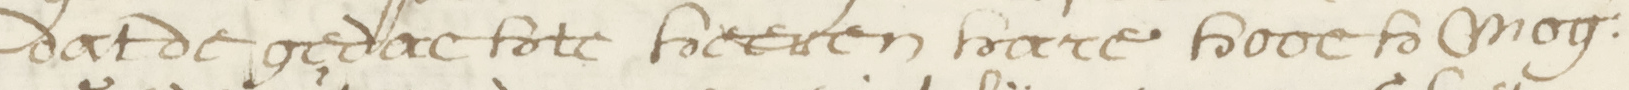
dat de gedachte heeren hare hooch mog:
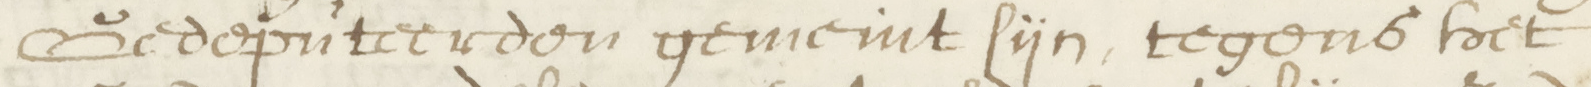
Gedeputeerden gemeint sijn, tegens het
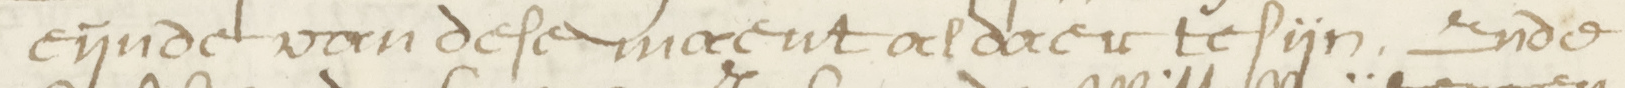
eijnde van dese maent aldaer te sijn. Ende
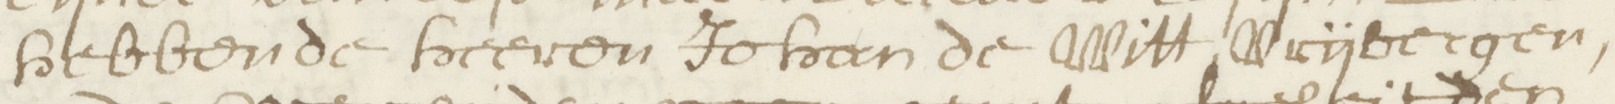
hebben de heeren Johan de Witt, Vrijbergen,
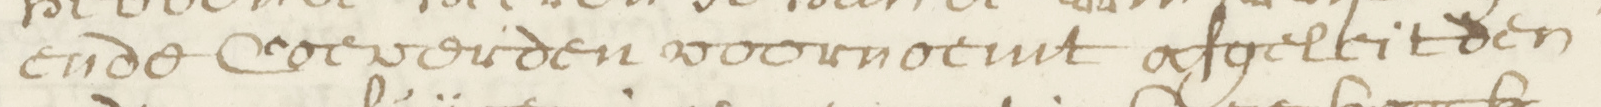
ende Coeverden voornoemt afgeleit den
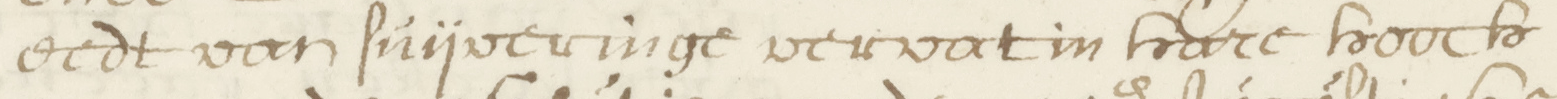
eedt van suijveringe vervat in hare hooch
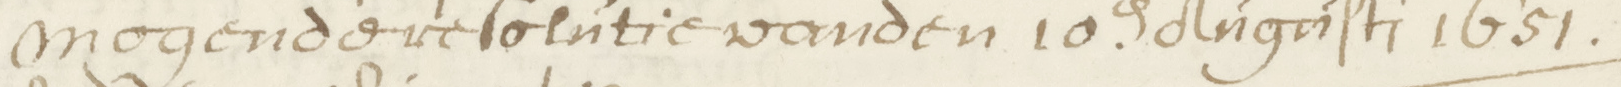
mogende resolutie vanden 10en. Augusti 1651.
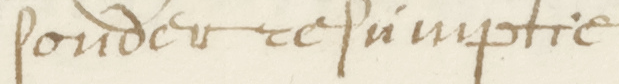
sonder resumptie.
